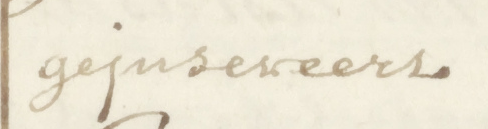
geinsereert
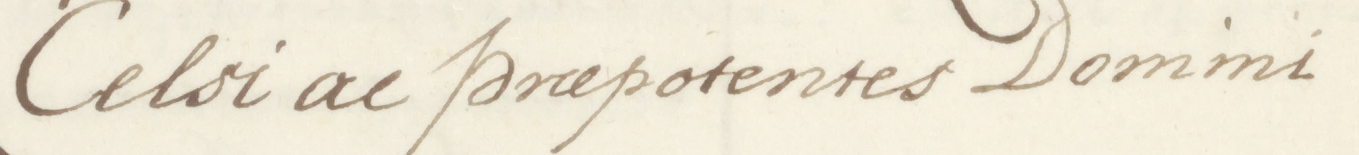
Celsi ac præpotentes Domini
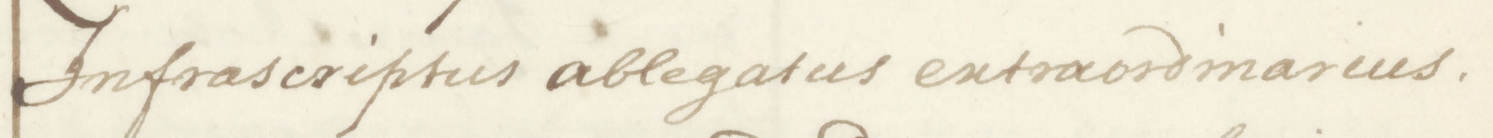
Infrascriptus ablegatus extraordinarius
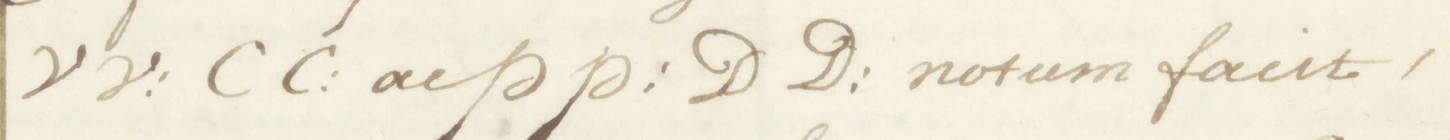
VV: CC: acPP: DD: notum facit,
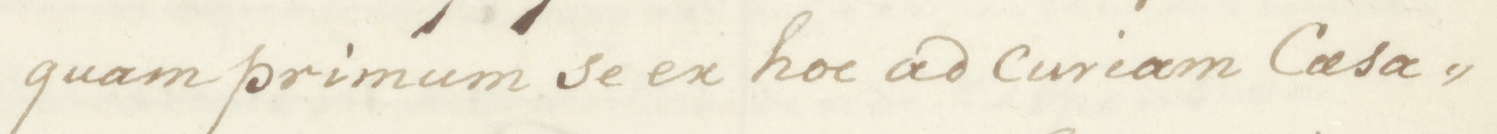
quam primum se ex hoc ad curiam casa„
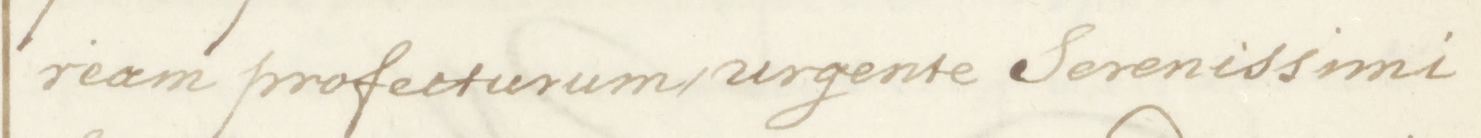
ream profecturum, urgente serenissimi
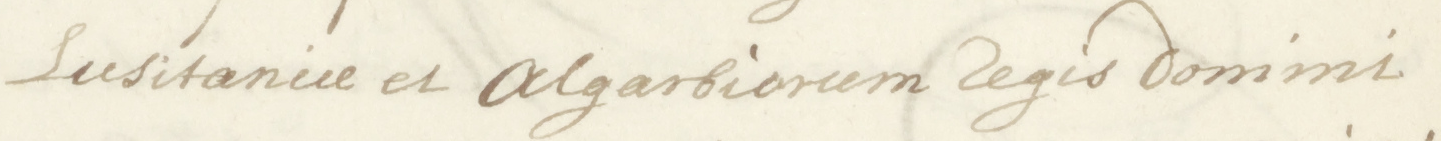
lusitanæ et algarbiorum regis domini
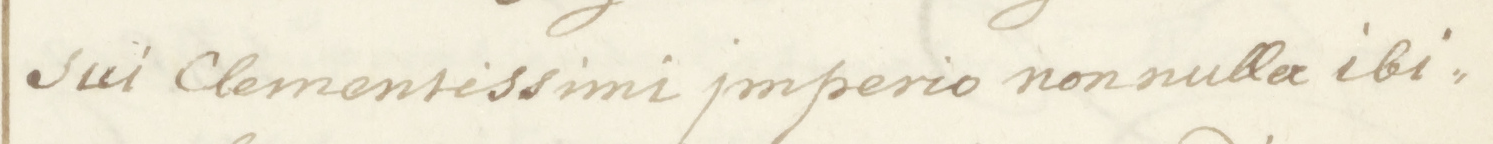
sui clementissimi imperio non nulla ibi„
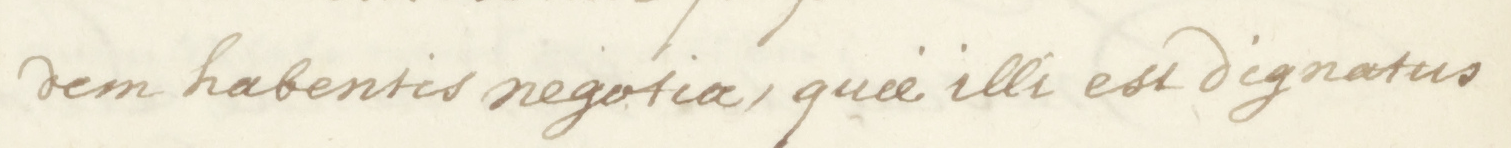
dem habentis nogotia, quæ illi est dignatus
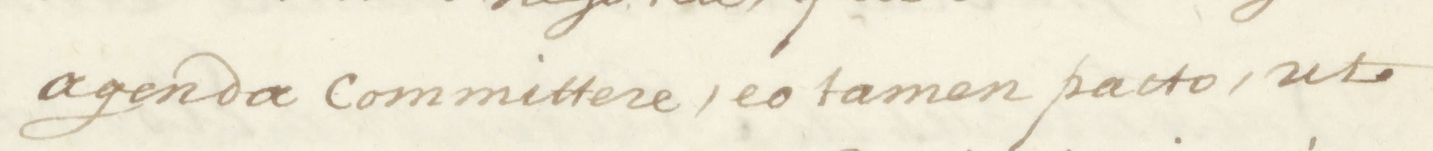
agenda committere, eo tamen pacto, ut
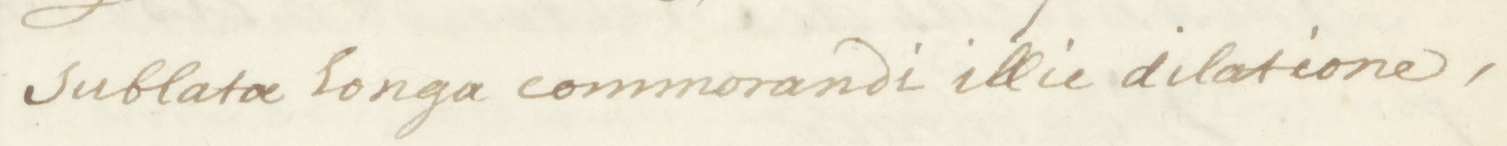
sublata longa commorandi illie dilatione,
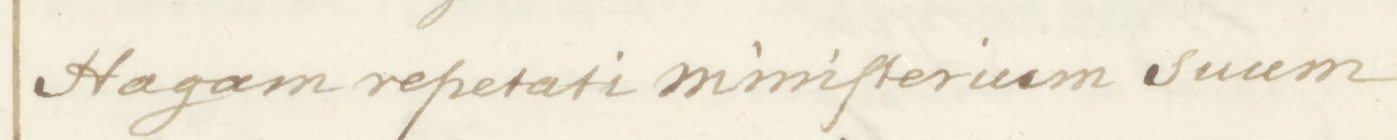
Hagam repetati ministerium suum
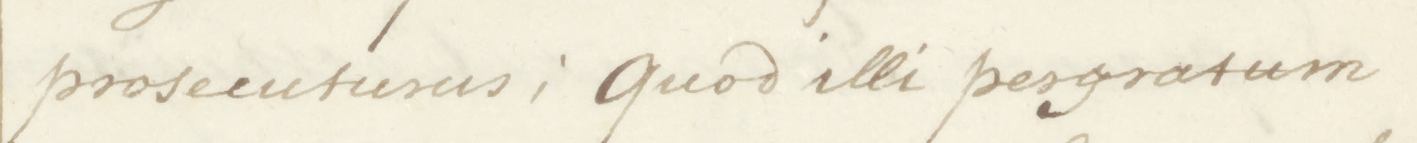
prosecuturus; quod illi pergratum
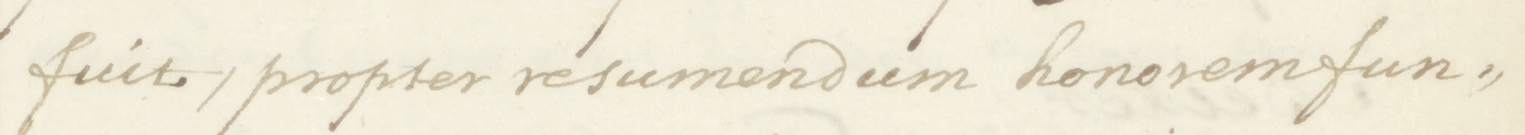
fuit, propter resumendum honorem fun„
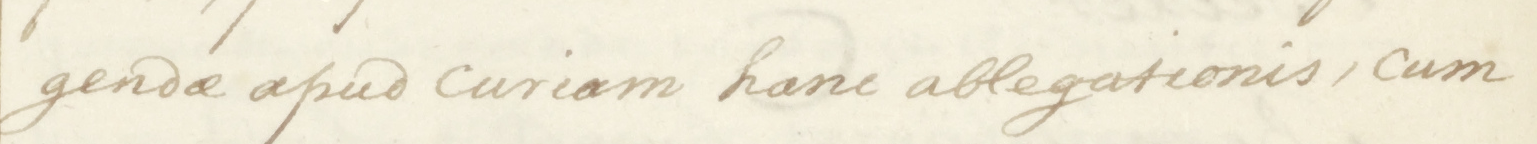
gendæ apud curiam hane ablegationis, cum
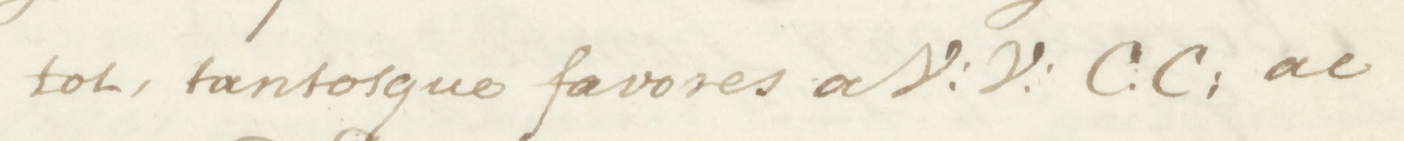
tot, tantosque favores a V:V: C.C: ac
